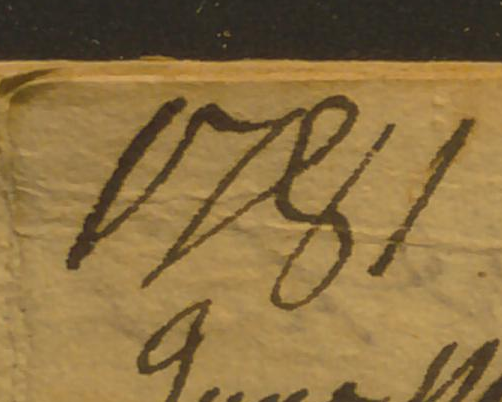1781
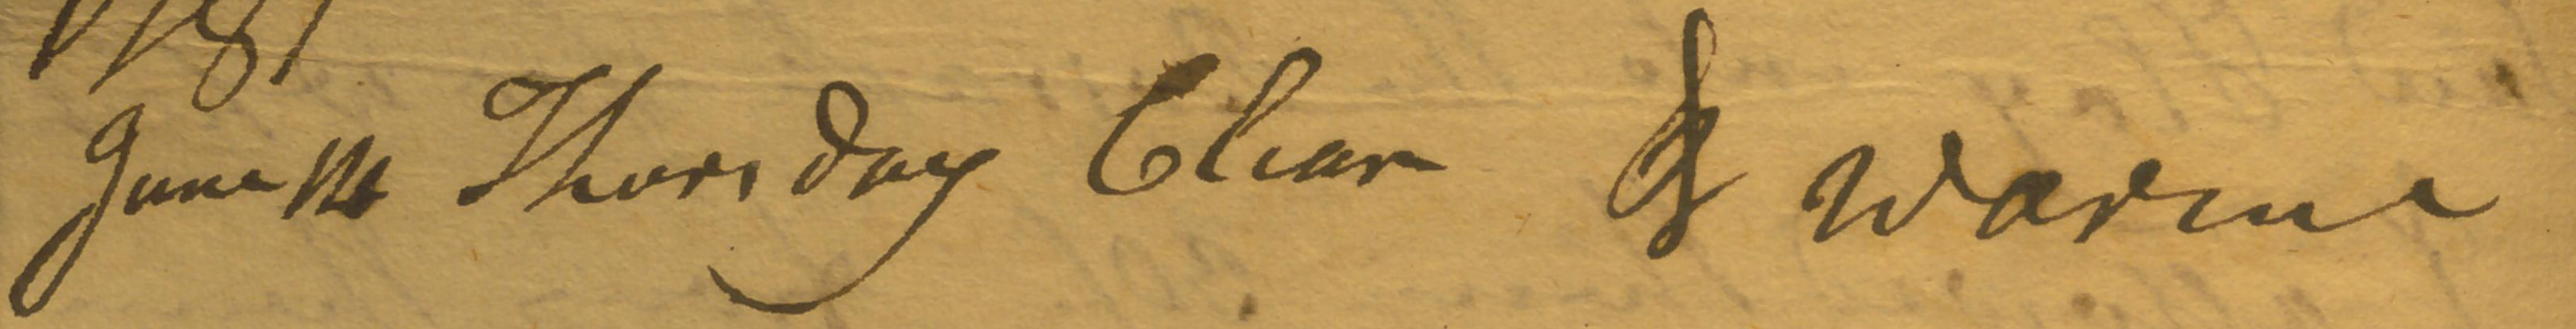June 14 Thursday Clear & warme
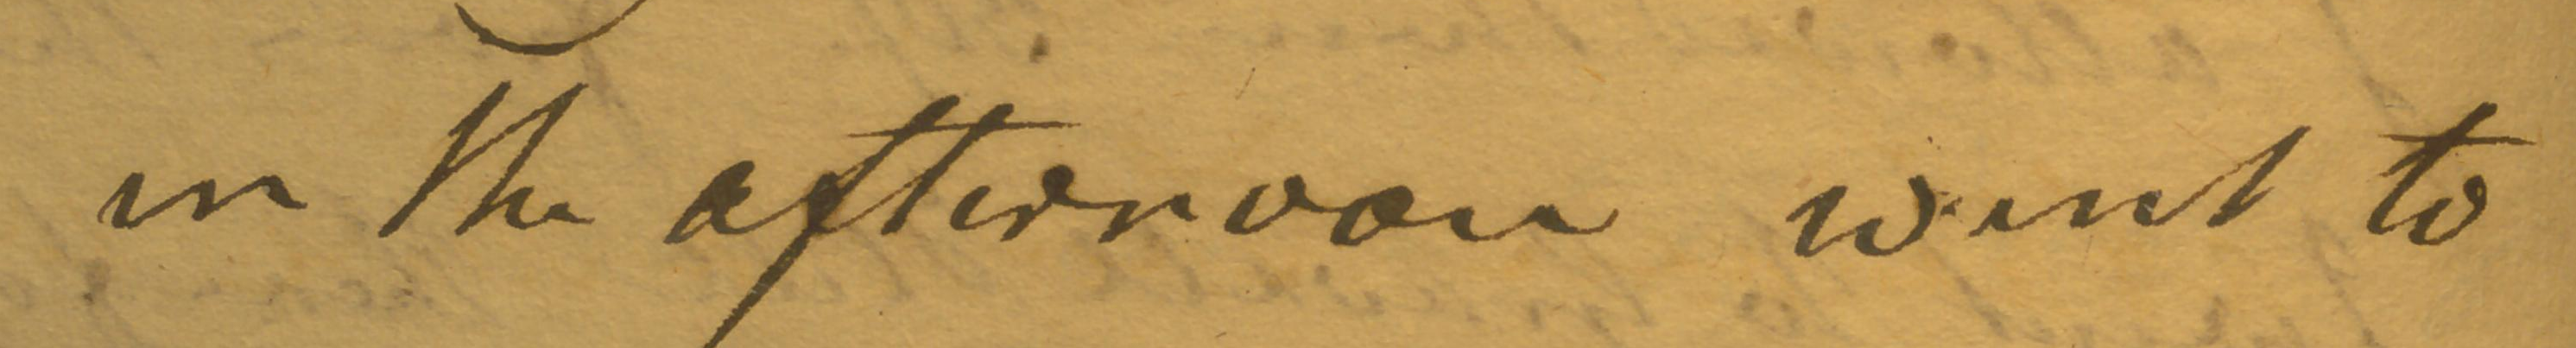in the afternoon, went to
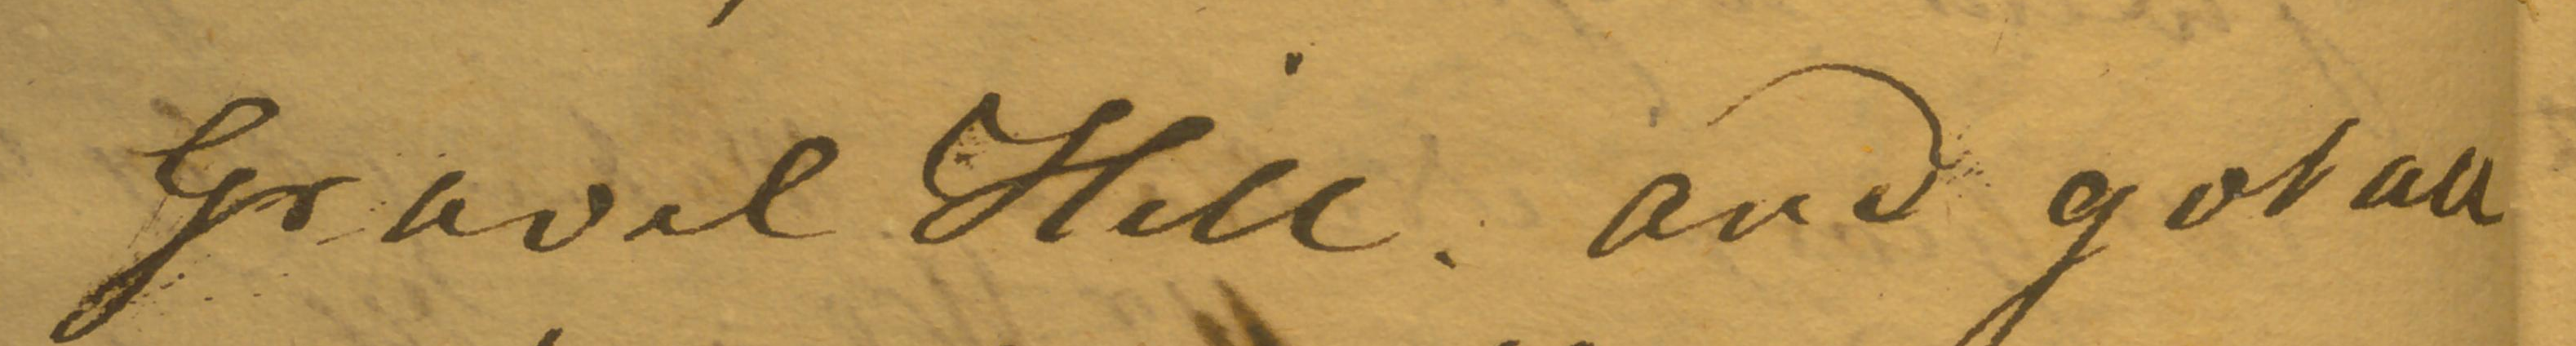Gravel Hill, and got all
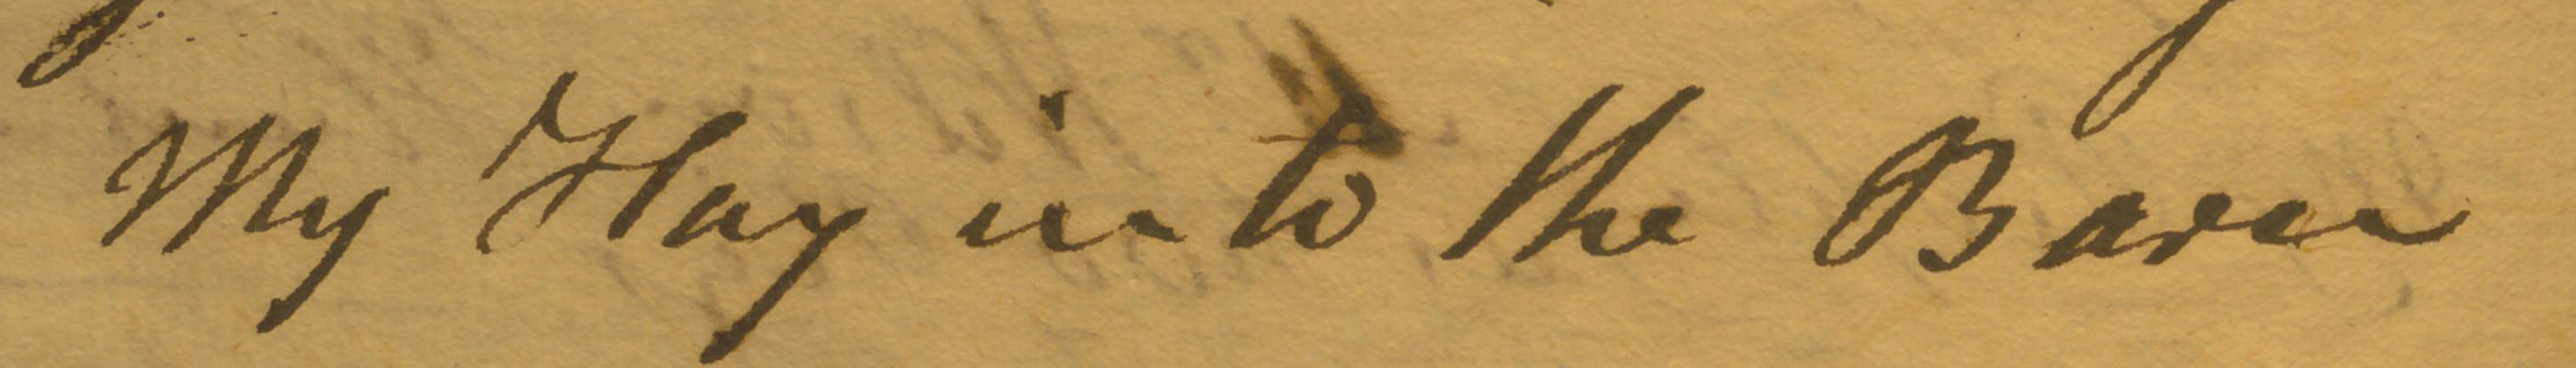My Hay into the Barn
